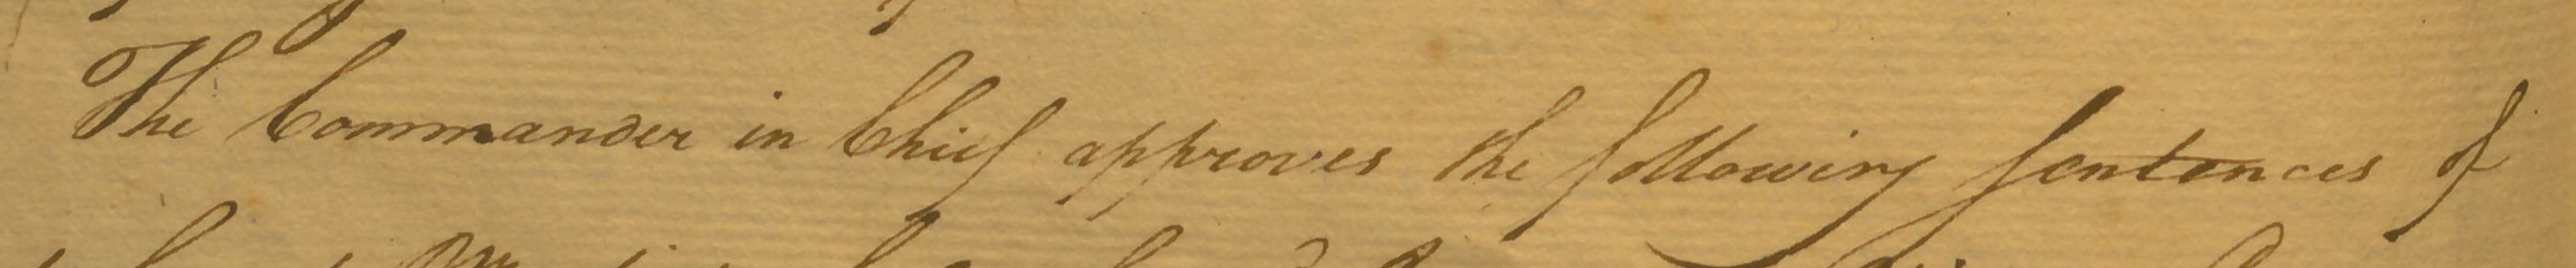The Commander in Chief approves the following sentences of
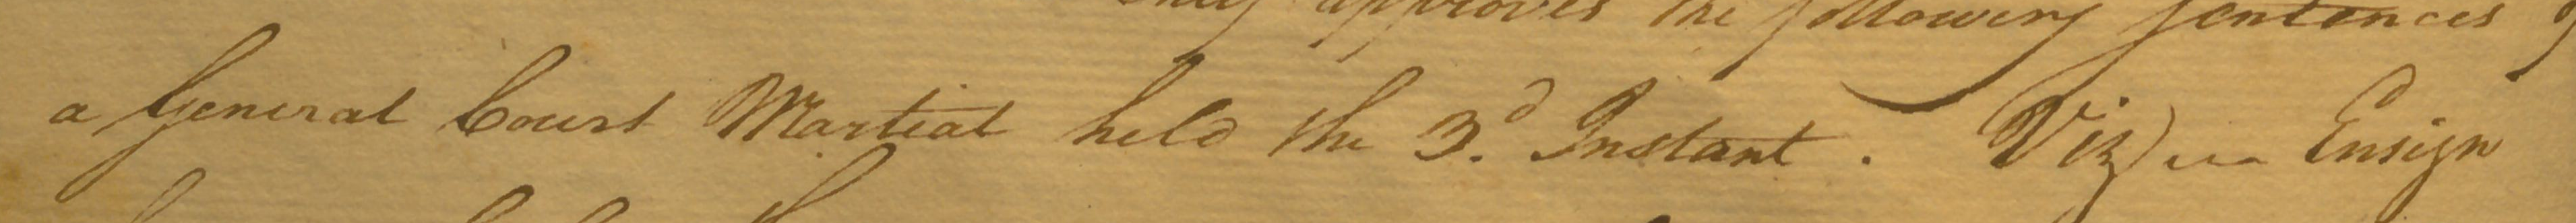a General Court Martial held the 3^d. Instant. Viz- Ensign
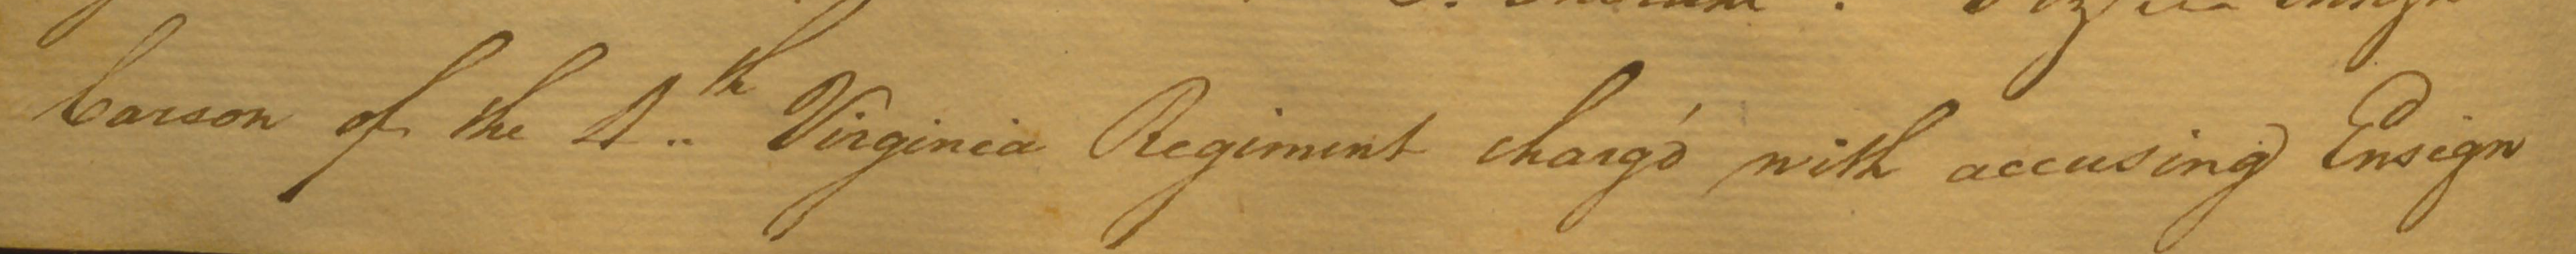Carson of the 4^th. Virginia Regiment charg'd with accusing Ensign
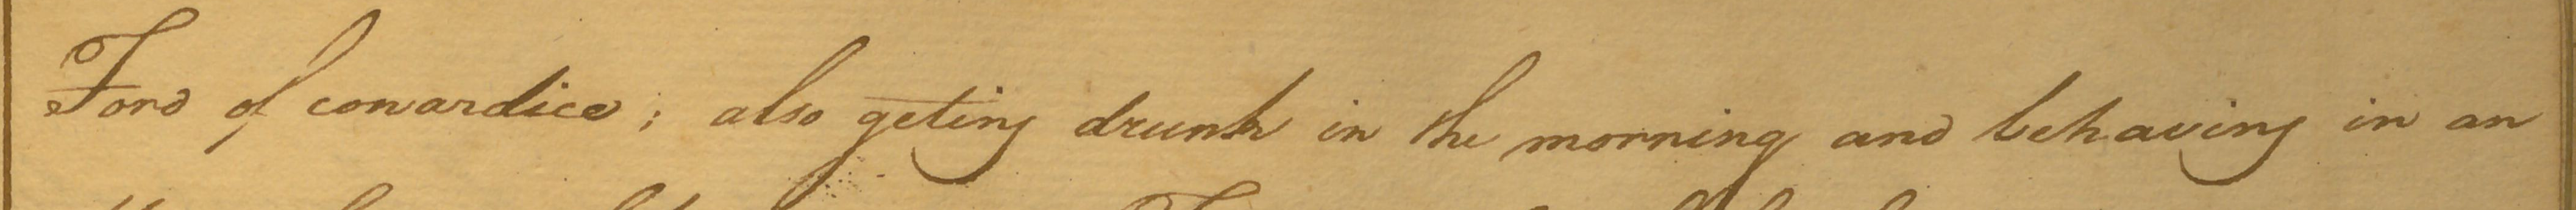Ford of cowardice; also geting drunk in the morning and behaving in an
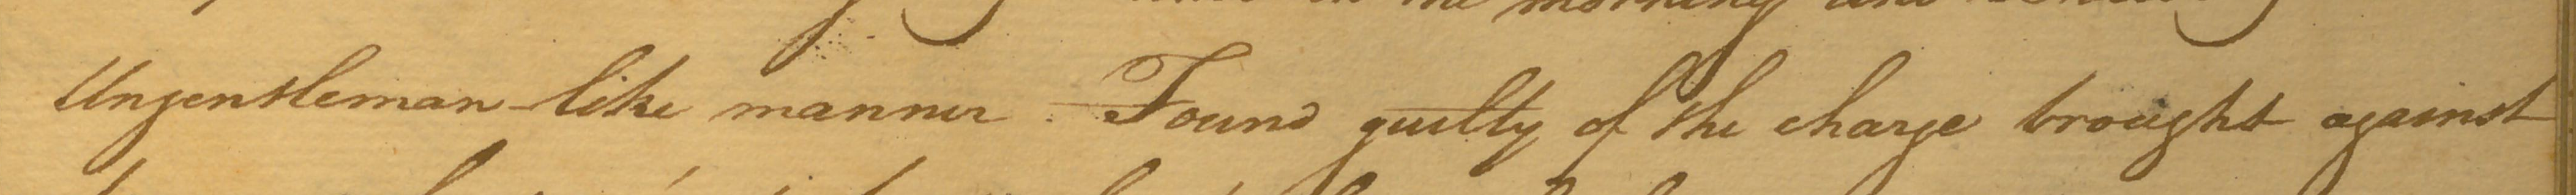Ungentleman-like manner. Found guilty of the charge brought against
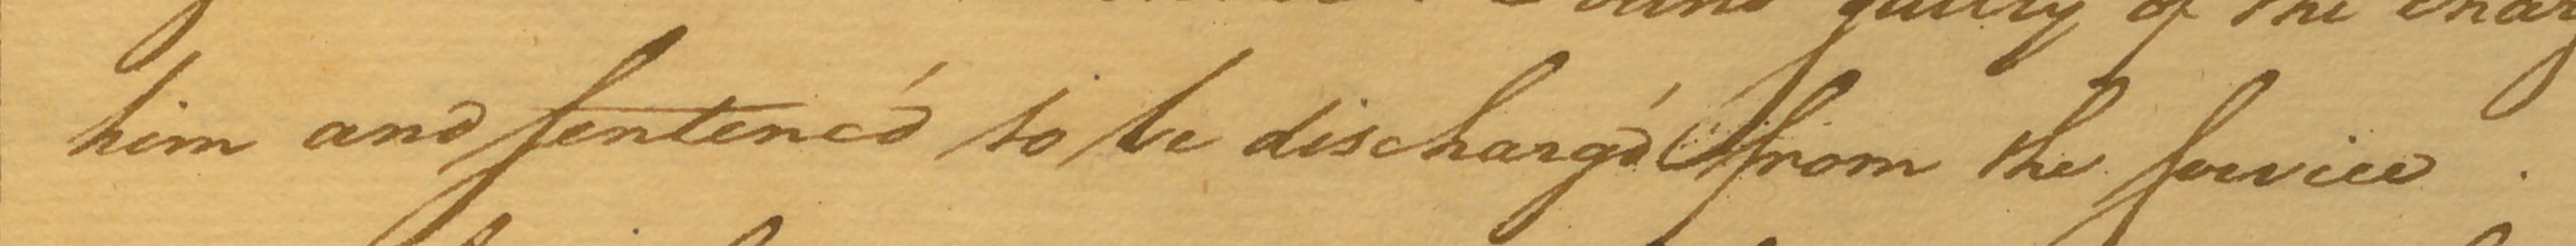him and sentenc'd to be discharg'd from the Service.
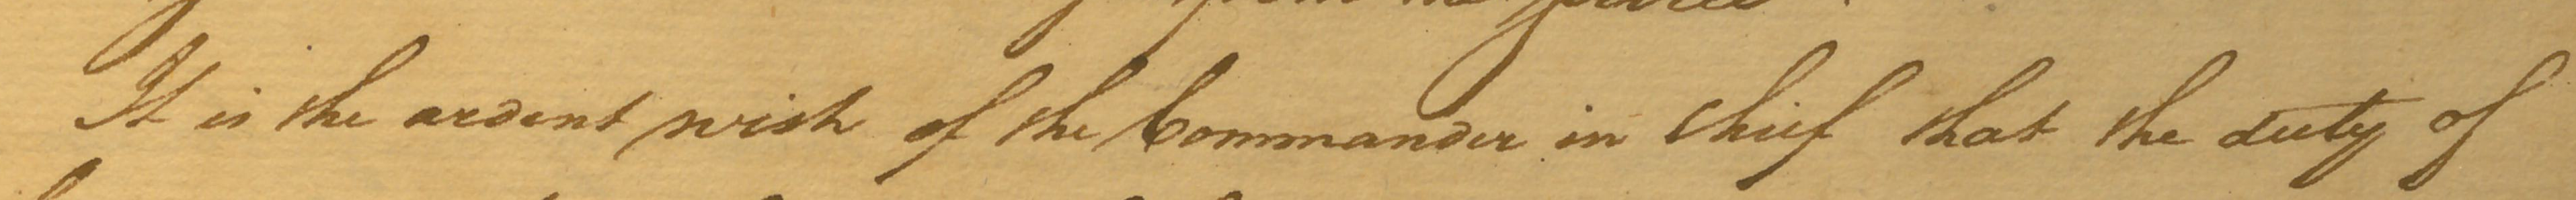It is the ardent wish of the Commander in Chief that the duty of
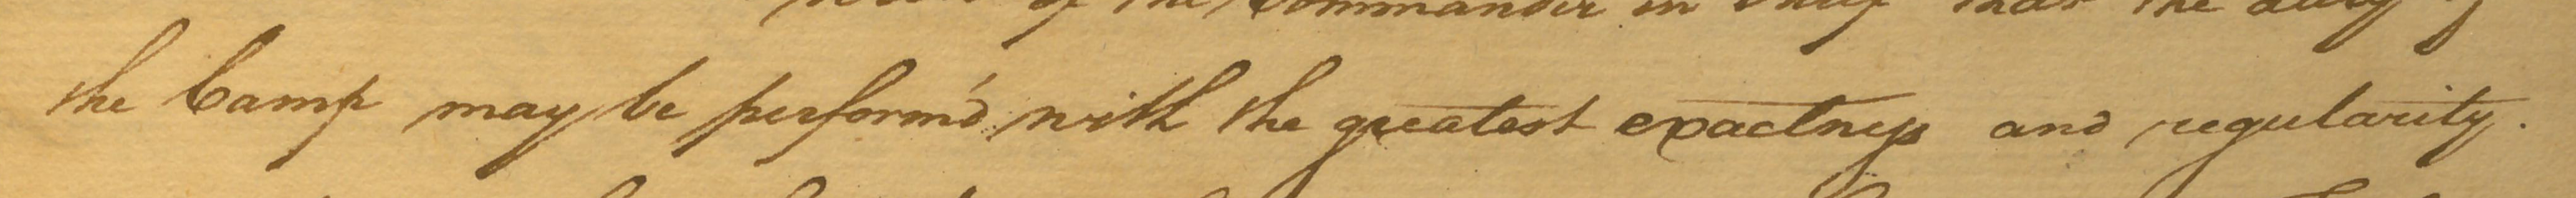the Camp may be perform'd with the greatest exactness and regularity.
